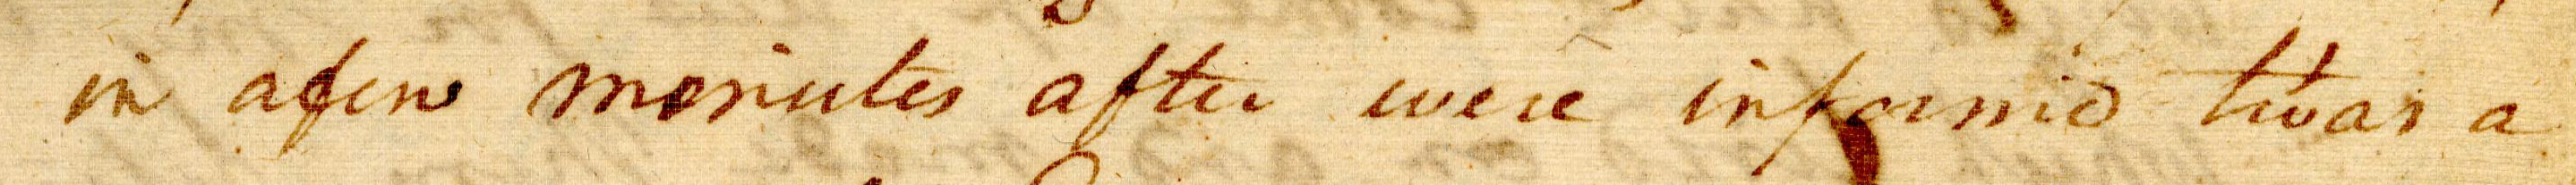in a few minutes after were inform'd t'was a
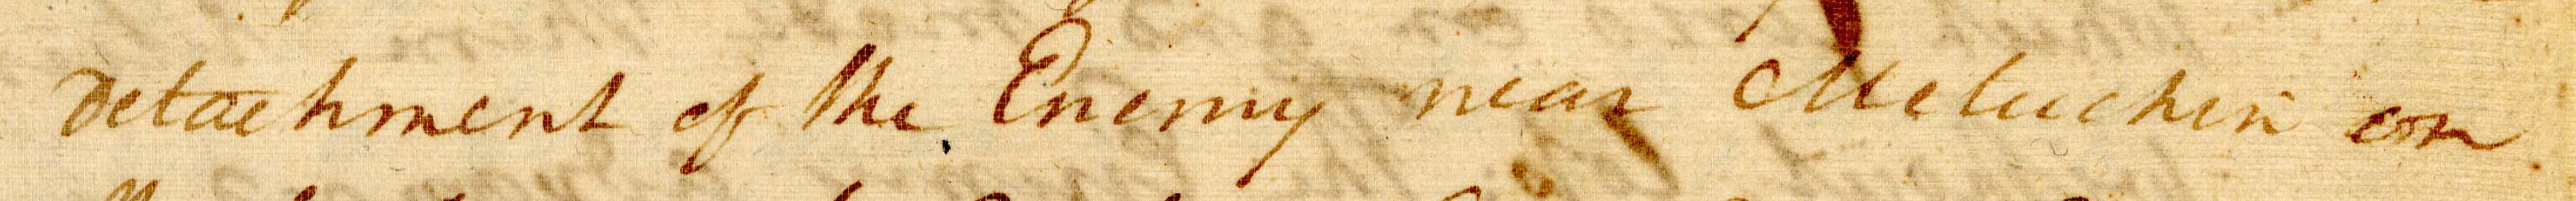detachment of the Enemy near Metuchen on
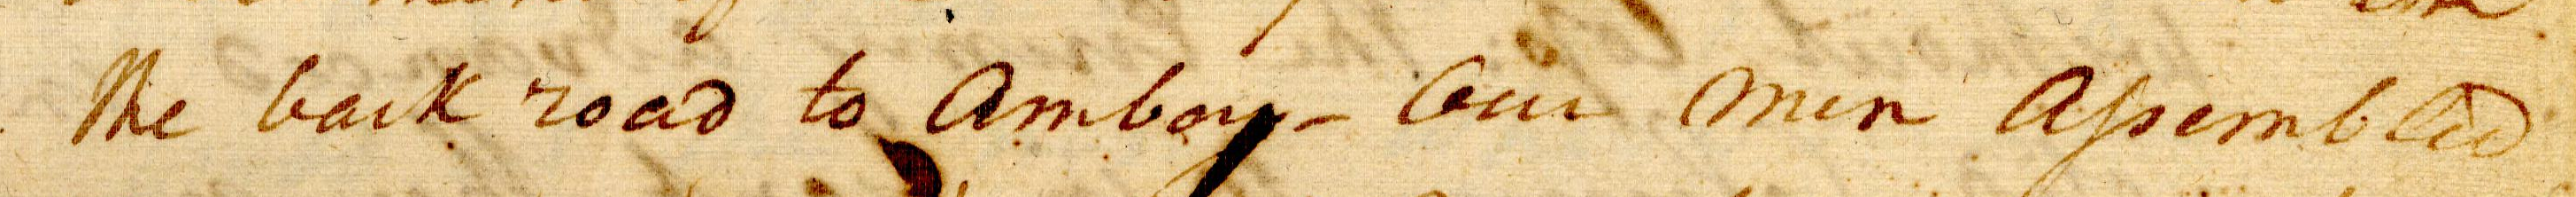the back road to Amboy- Our Men assembled
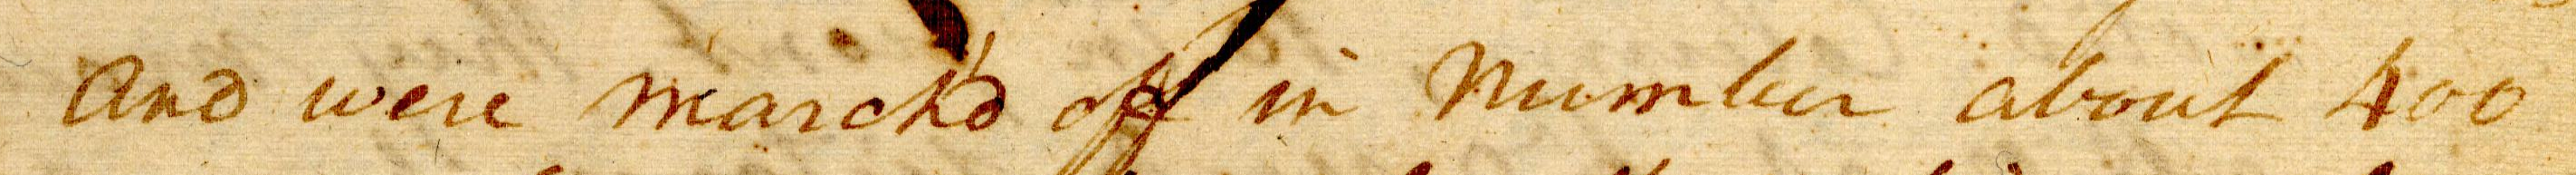and were march'd off in Number about 400
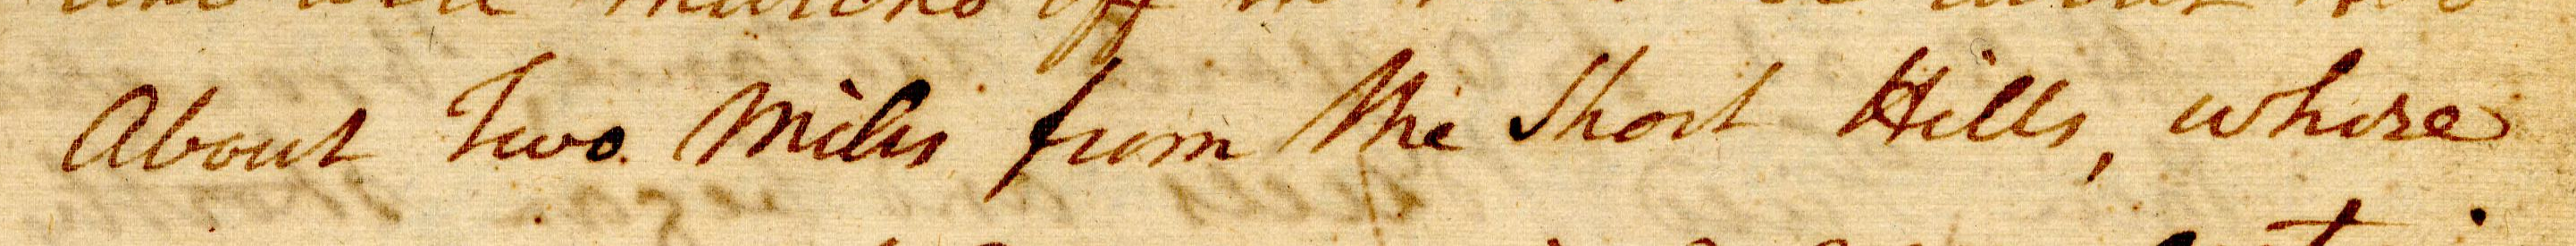About Two Miles from the Short Hills, where
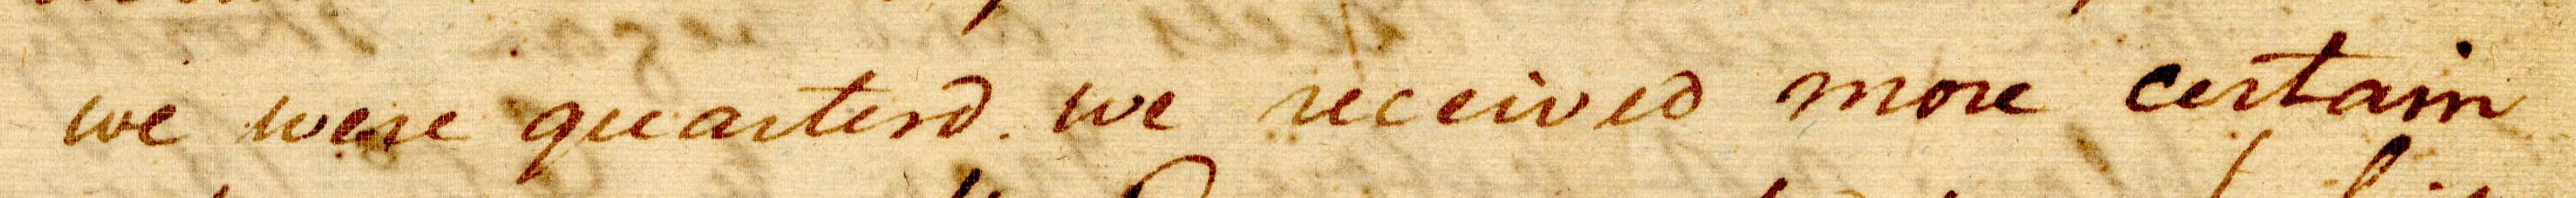we were quarterd. we received more certain
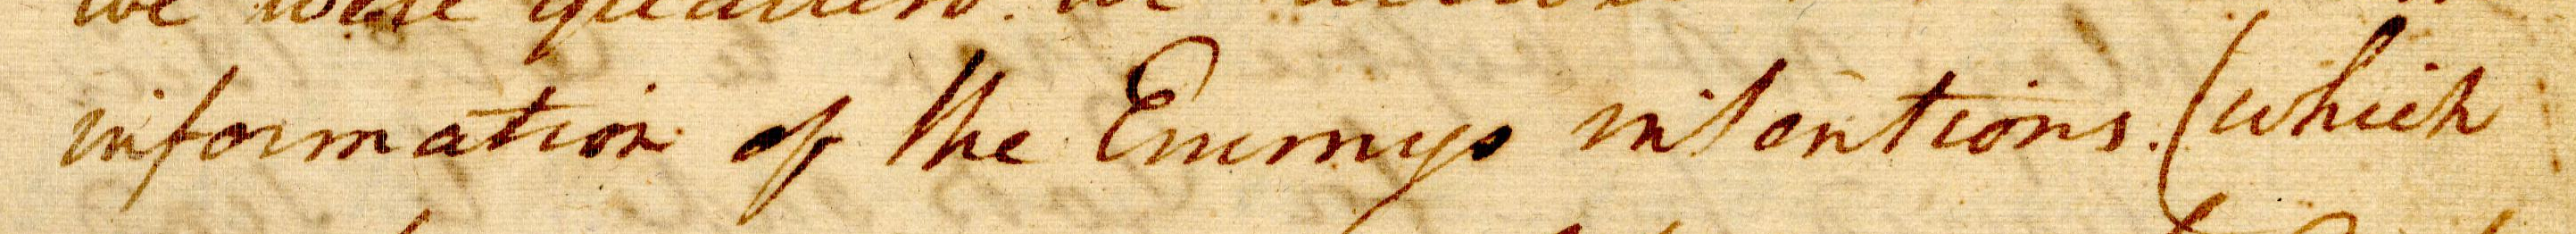information of the Enemys intentions (which
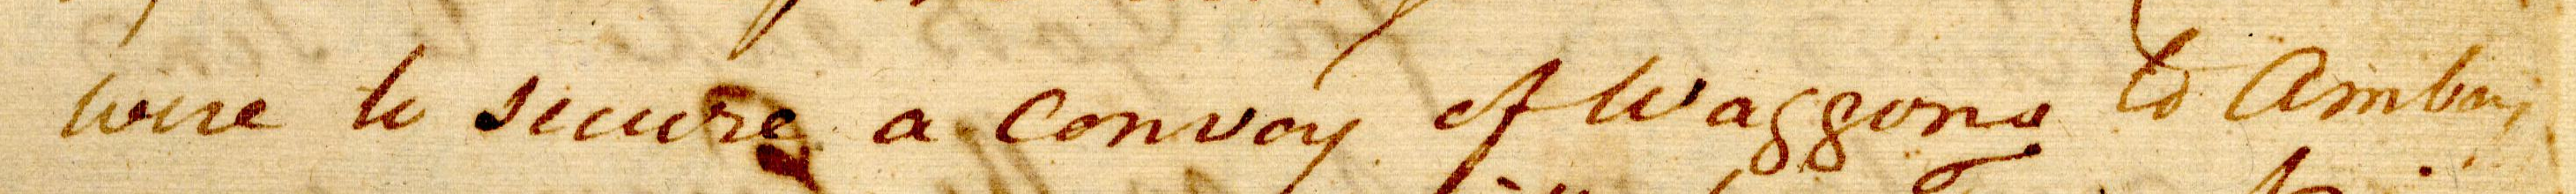were to secure a convoy of waggons to Amboy
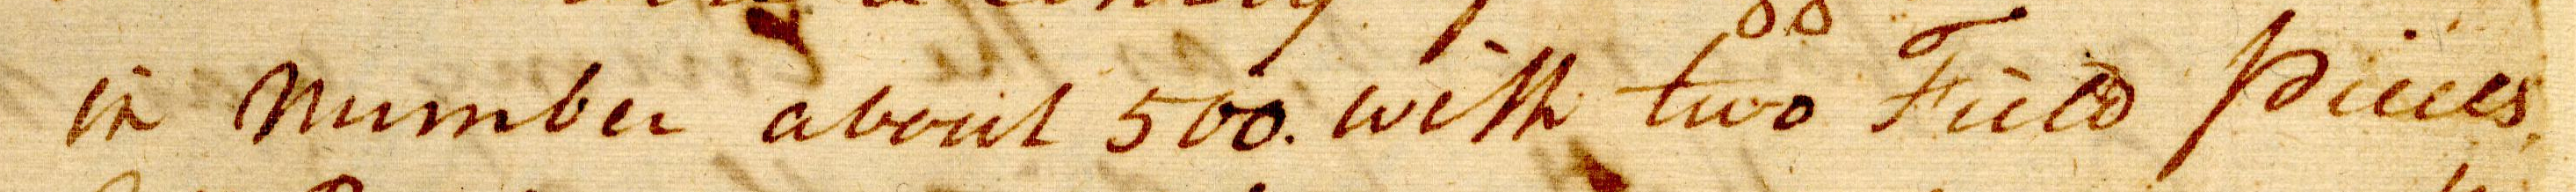in Number about 500 with two Field Pieces
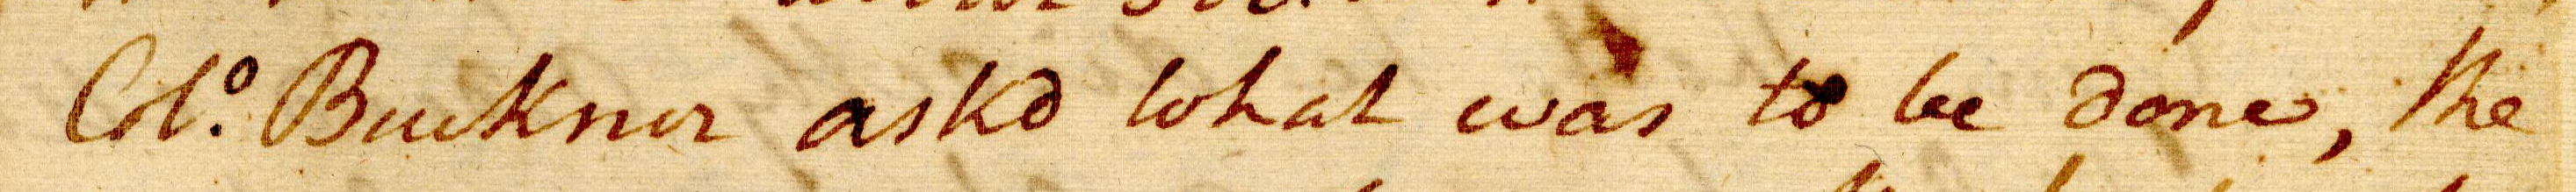Col^o. Buckner askd what was to be done, the
